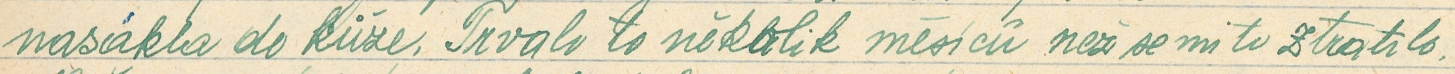nasákla do kůže. Trvalo to několik měsíců než se mi to ztratilo.
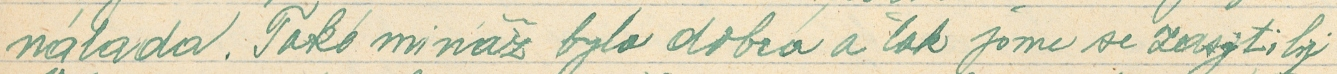nálada. Také mináž byla dobrá a tak jsme se zasytily.
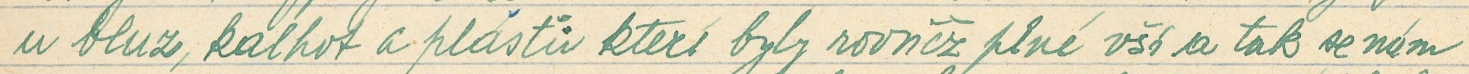u bluz, kalhot a plašťů které byly rovněž plné vší a tak se nám
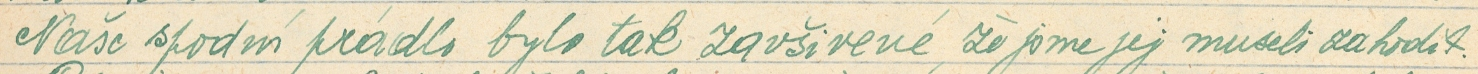Naše spodní prádlo bylo tak zavšivené, že jsme jej museli zahodit.
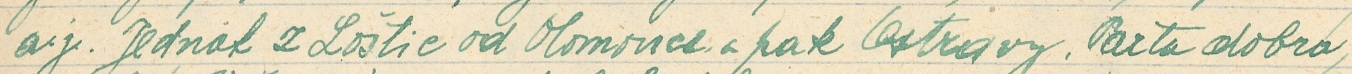a. j. Jednak z Loštic od Olomouce a pak Ostravy. Parta dobrá,
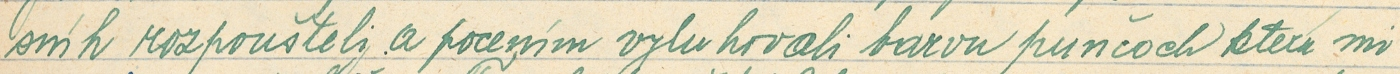sníh rozpoušteli .a pocením vyluhovali barvu punčoch která mi
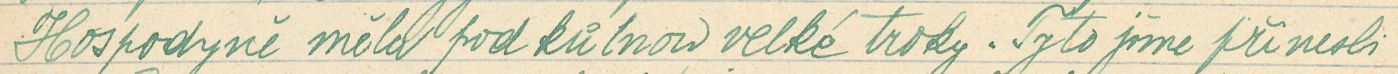Hospodyně měla pod kůlnou velké troky. Tyto jsme přinesli
